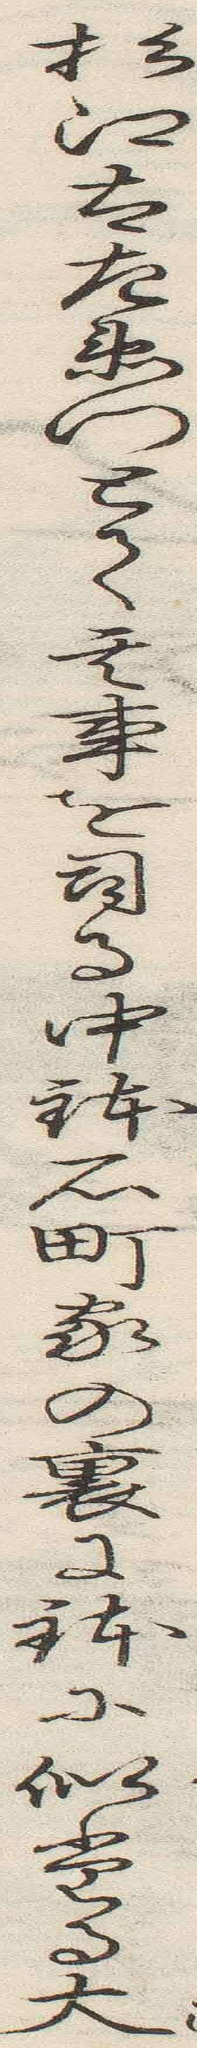杉江太左衛門とて其事を司る中鉢石町家の裏に鉢に似たる大
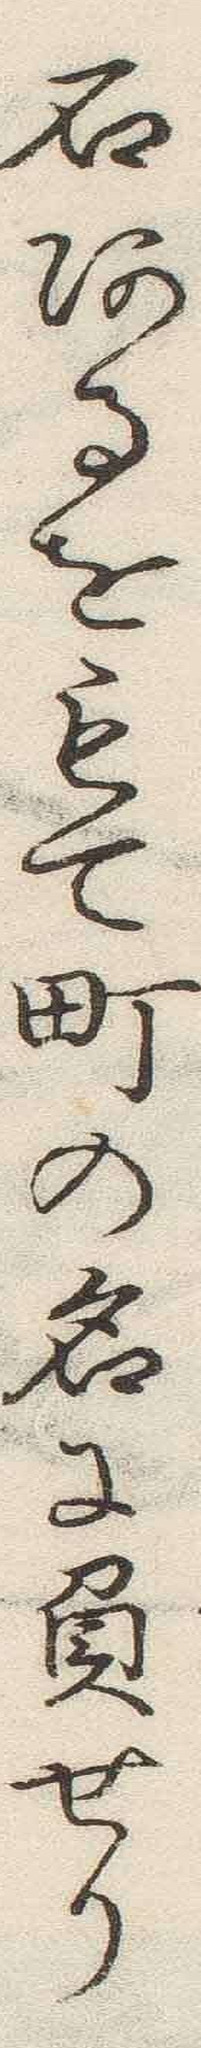石あるをもて町の名に負せり
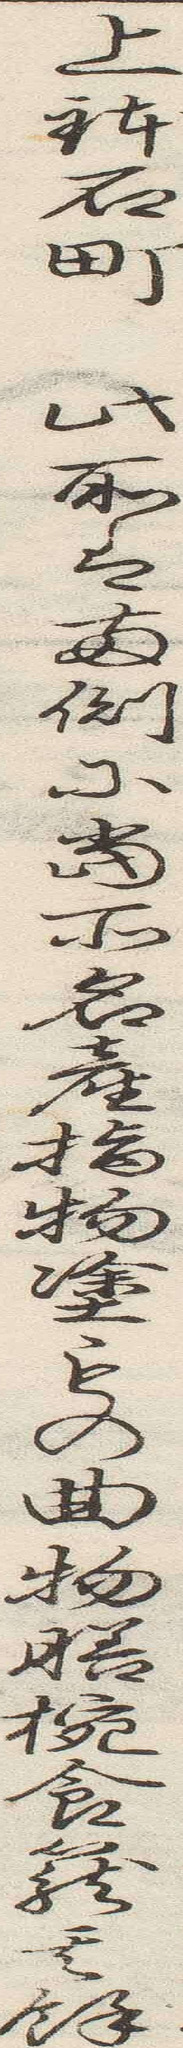上鉢石町此所は両側に當所名産指物塗もの曲物膳椀食籠其餘
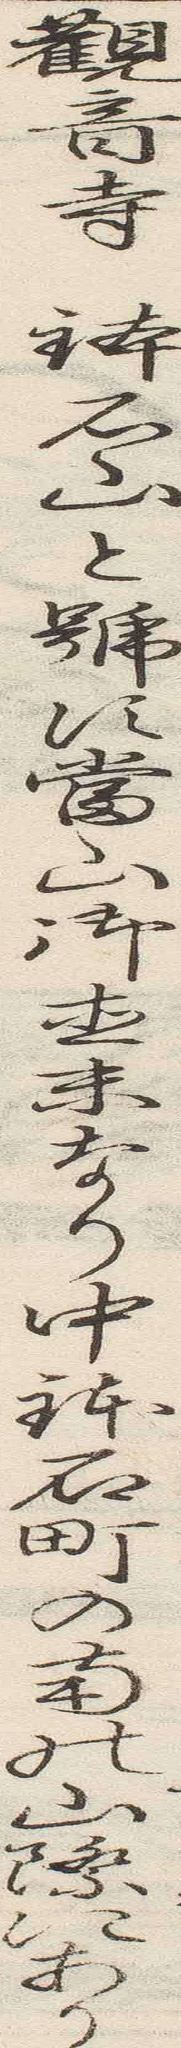觀音寺鉢石山と號す當山御直末なり中鉢石町の南の山際にあり
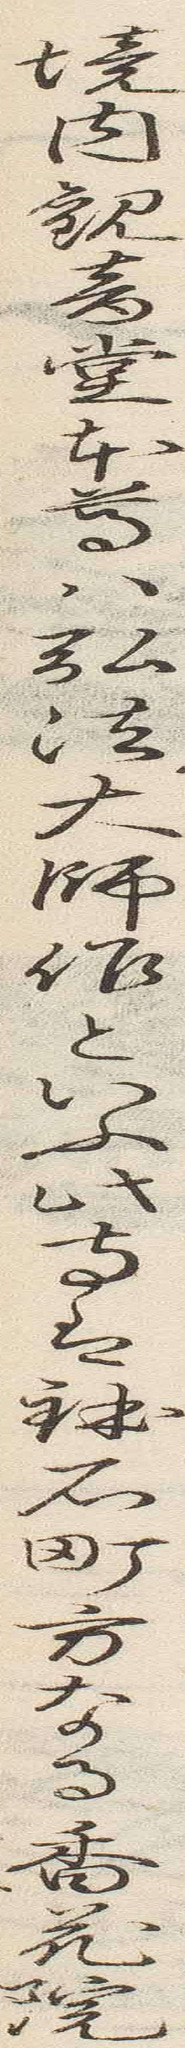境内観音堂本尊は弘法大師作といふ此寺は鉢石町方なる香花院
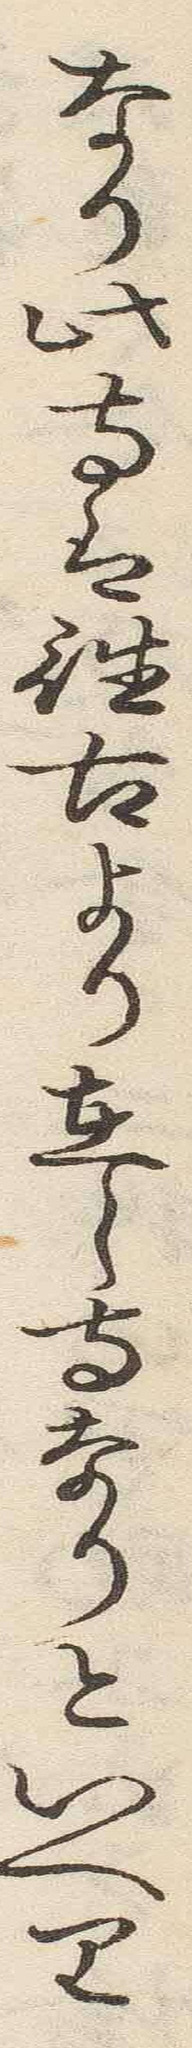なり此寺は徃古より在し寺なりといへり
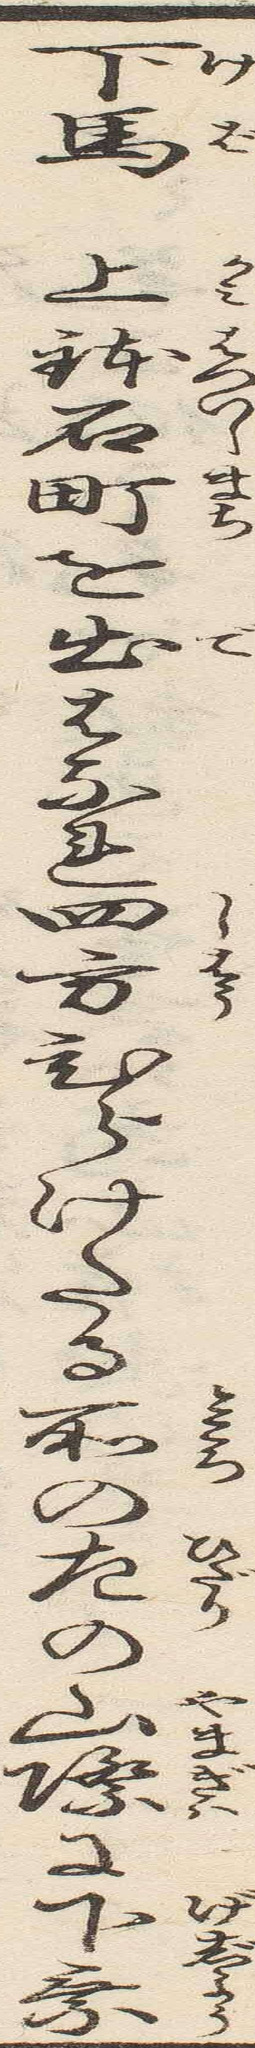下馬上鉢石町を出はなれ四方ひらけたる所の左の山際に下乗
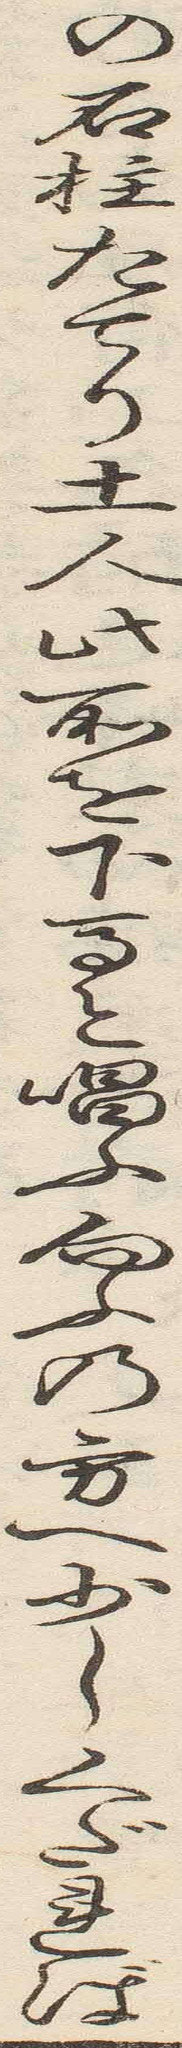の石柱たてり土人此所を下馬と唱ふ向ふの方へ少しくだれば
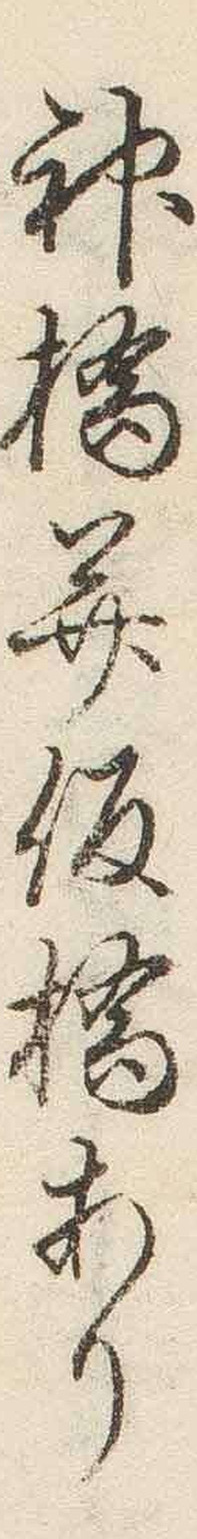神橋并仮橋あり
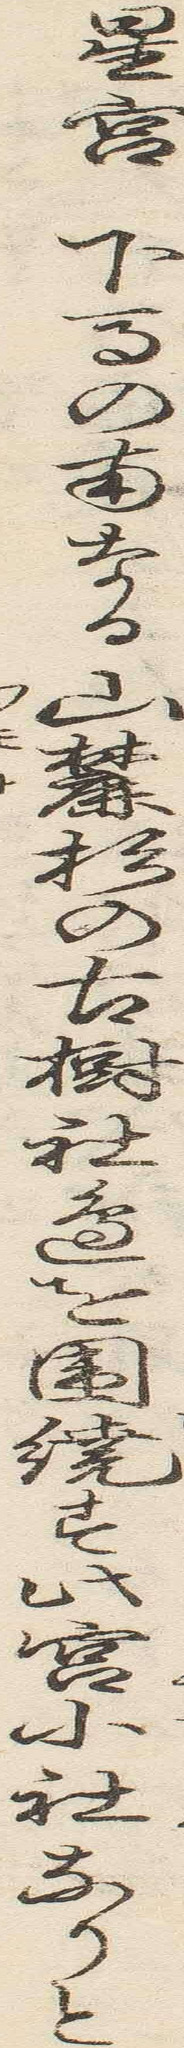星宮下馬の南なる山麓杉の古樹社邊を圍繞す此宮小社なりと
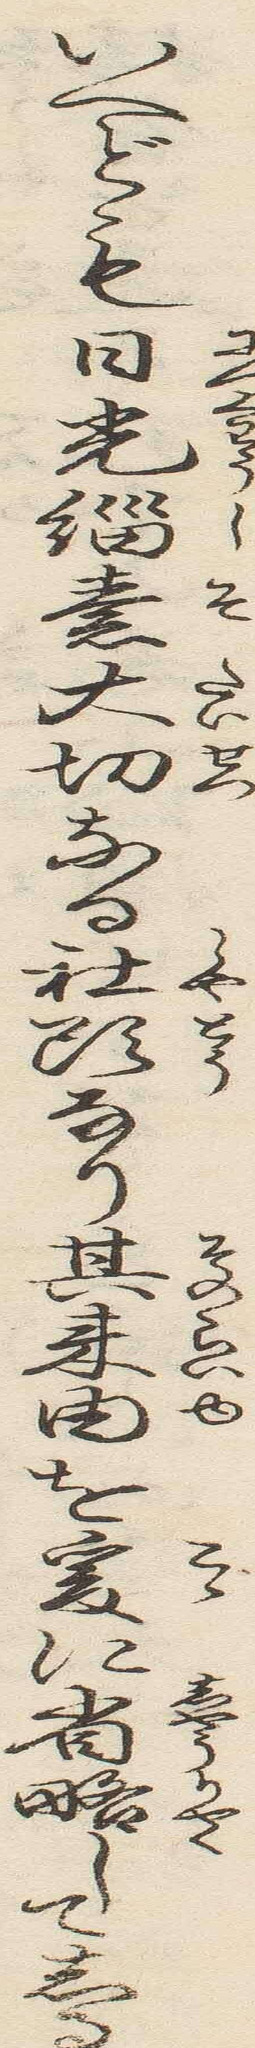いへども日光緇素大切なる社頭なり其来由を爰に省略してしる
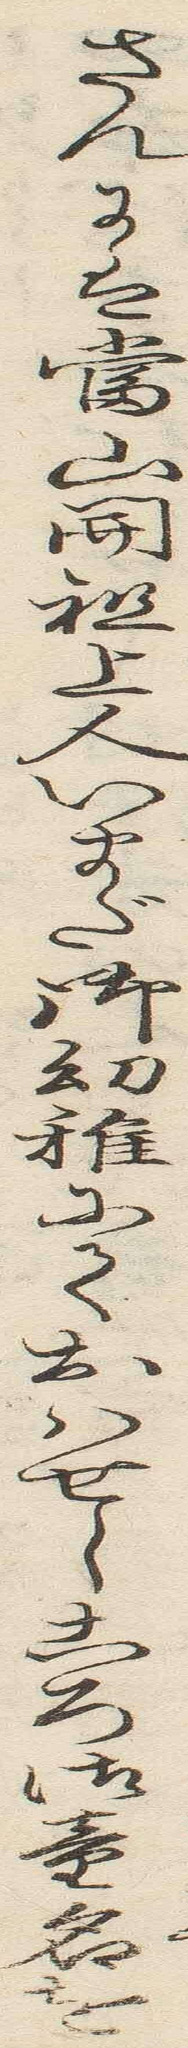さんには當山開祖上人いまだ御幼稚にておはせしころ御童名を
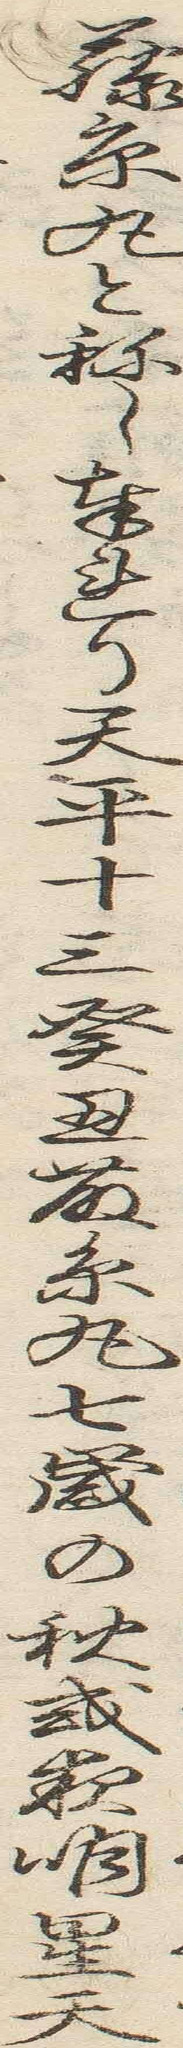藤糸丸と称し奉れり天平十三癸丑藤糸丸七歳の秋或夜明星天
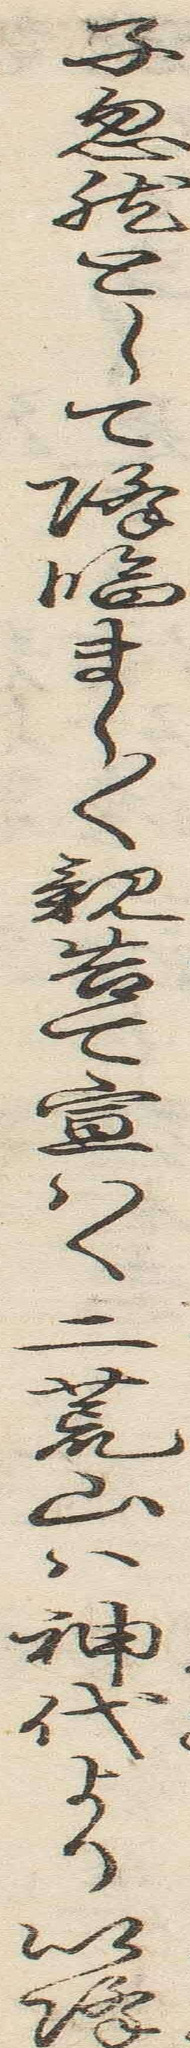子忽然として降臨まし〳〵親告て宣はく二荒山は神代より以降
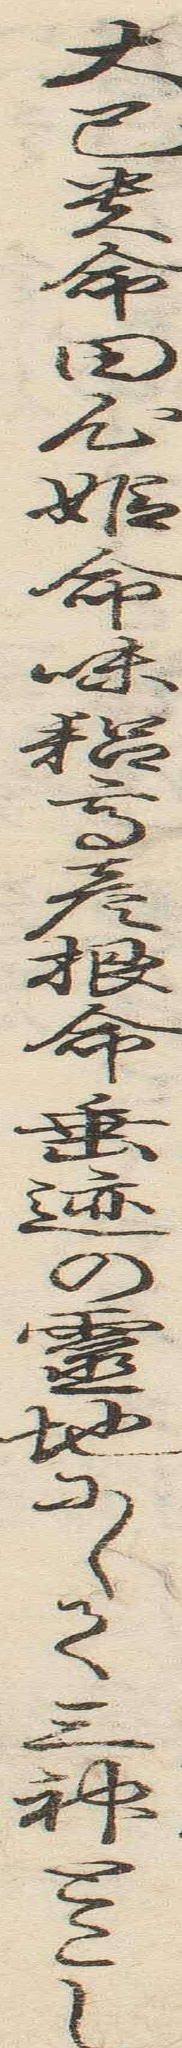大己貴命田心姫命味耜高彦根命垂迹の靈地にして三神とこし
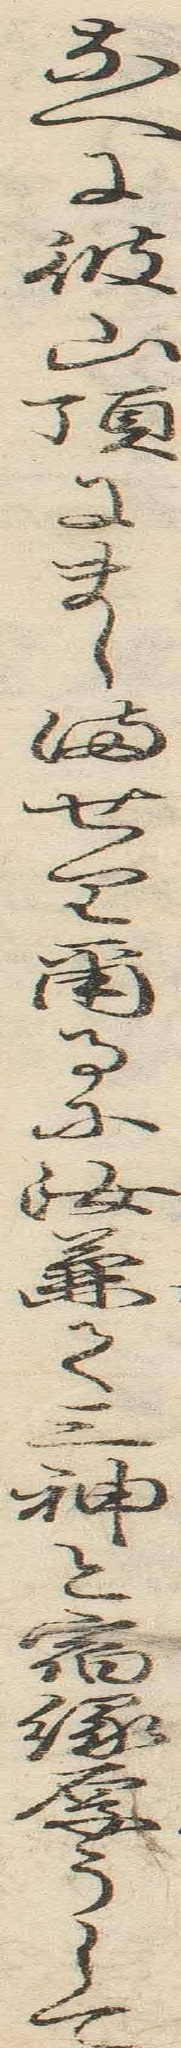なへに彼山頂にましませり爾るに汝兼て三神と宿縁厚うして
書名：日光山志
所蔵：東京学芸大学附属図書館 国文学研究資料館
